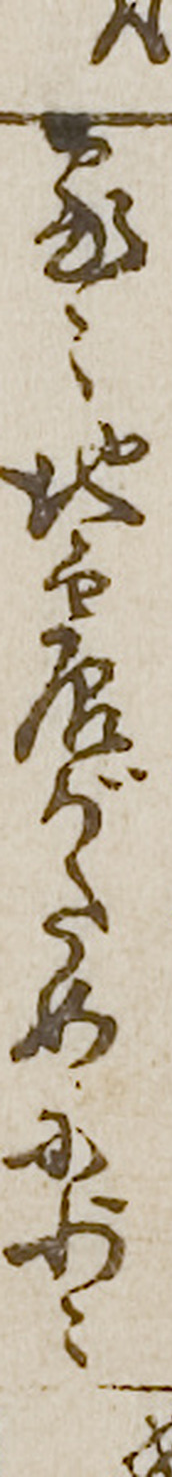家々地震がために少々
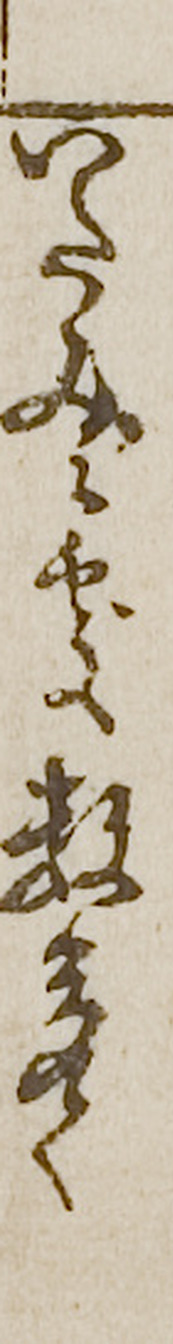いたみ候処数多く
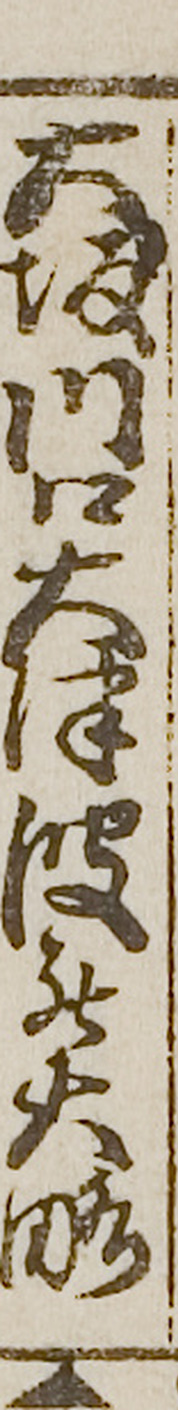大坂川口大津波の大略
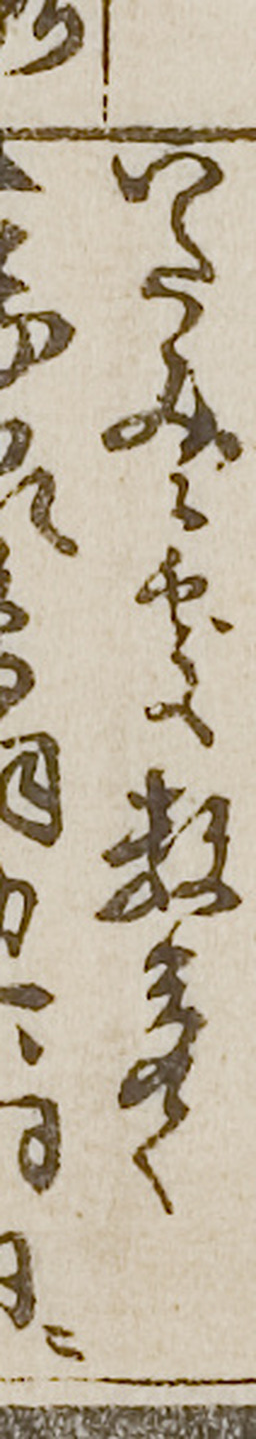▲志州鳥羽辺は同日に
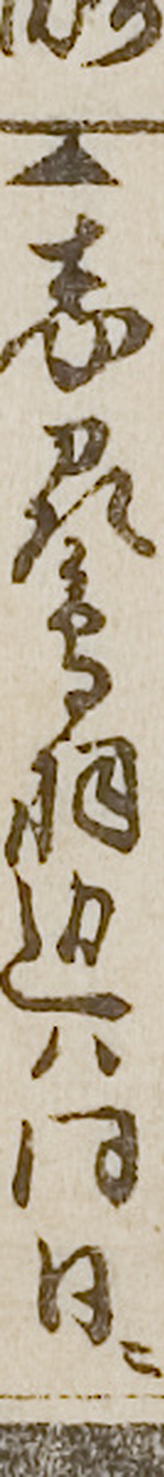▲志州鳥羽辺は同日に
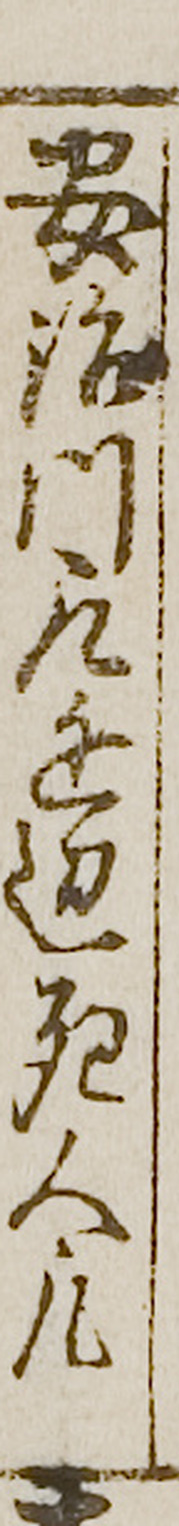安治川凡近辺死人凡
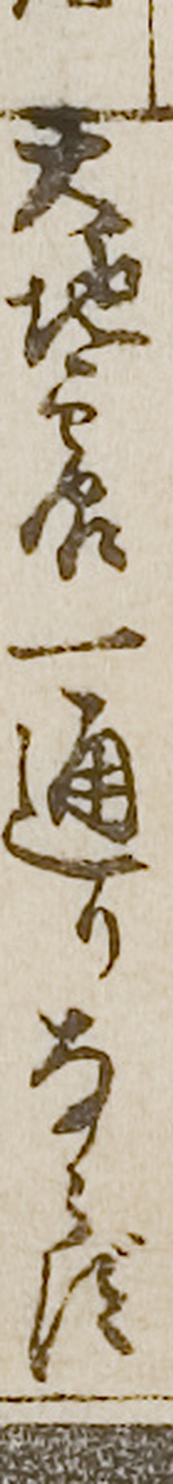大地震一通りならず
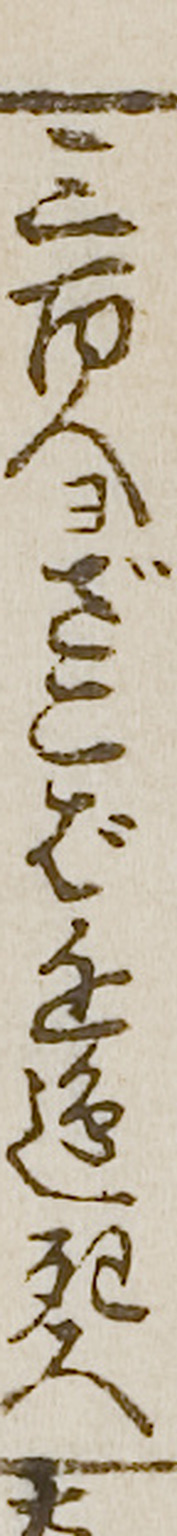三百人ヨざこば近辺死人
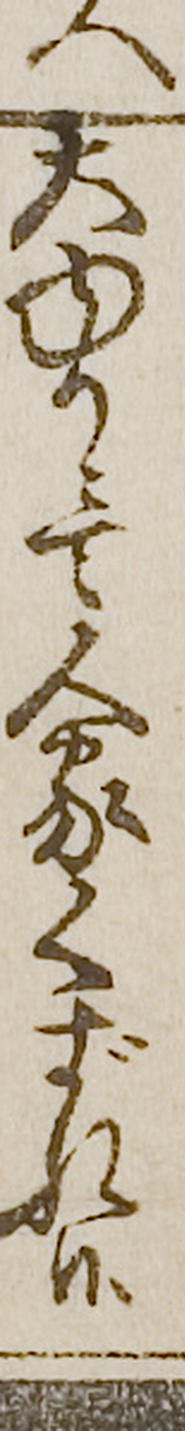大ゆりにて人家くずれ候
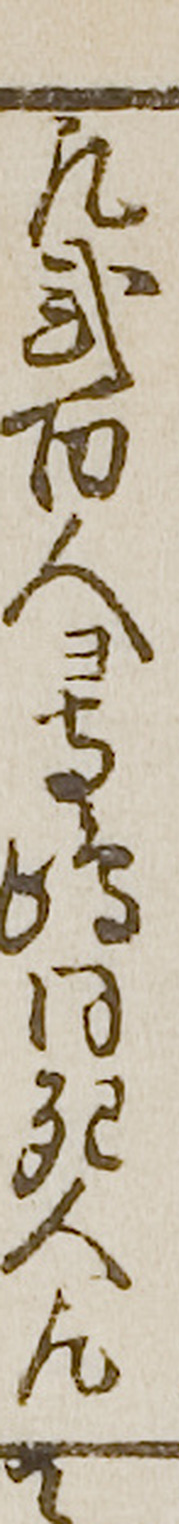凡弐百人ヨ寺島同死人凡
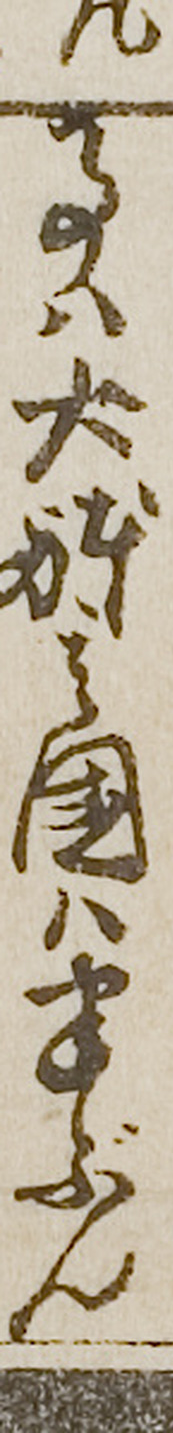事は大躰其国は半ぶん
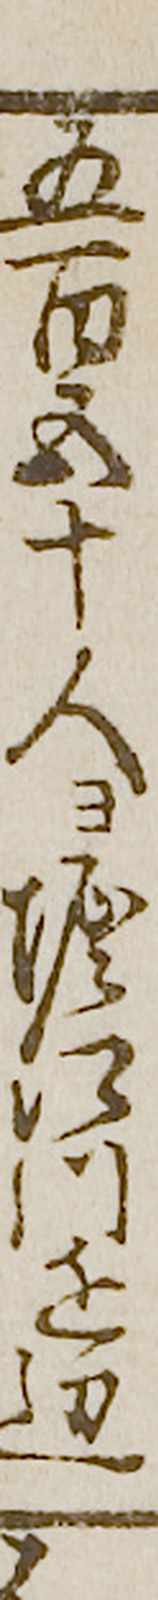五百五十人ヨ堀江川近辺
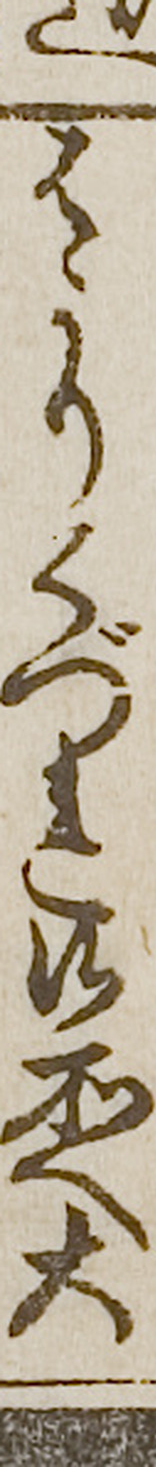はかりくづれ候所へ大
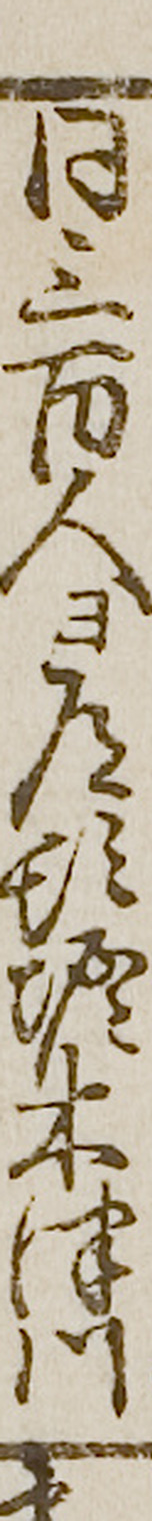同三百人ヨ道頓堀木津川
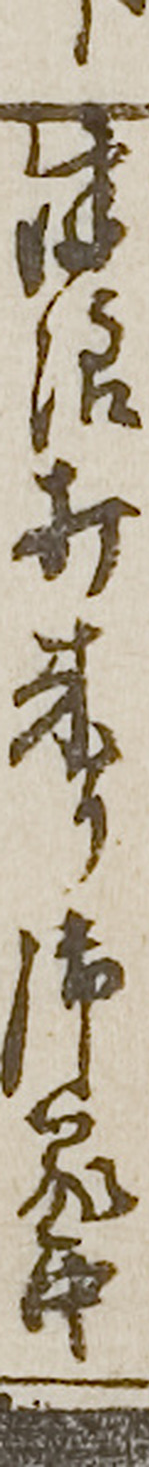津浪打来り御家中
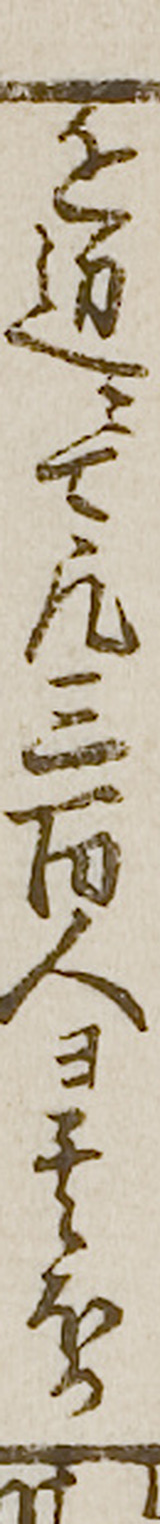近辺にて凡三百人ヨ其ほか
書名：諸国大地震大津波 三編
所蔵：東京大学総合図書館 General Library in the University of Tokyo, JAPAN
